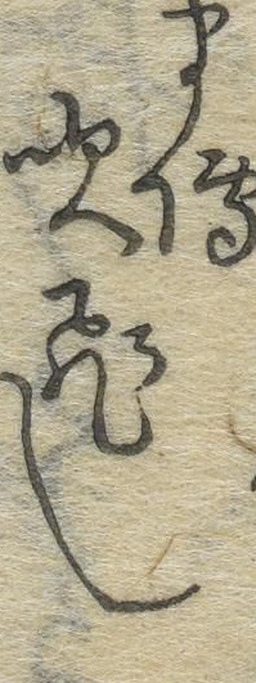吹飛し

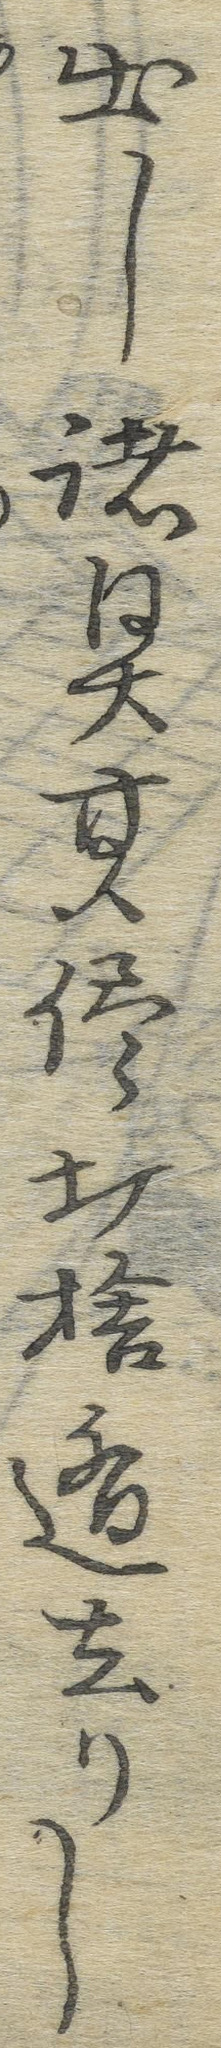出し諸具其侭打捨遁去りし
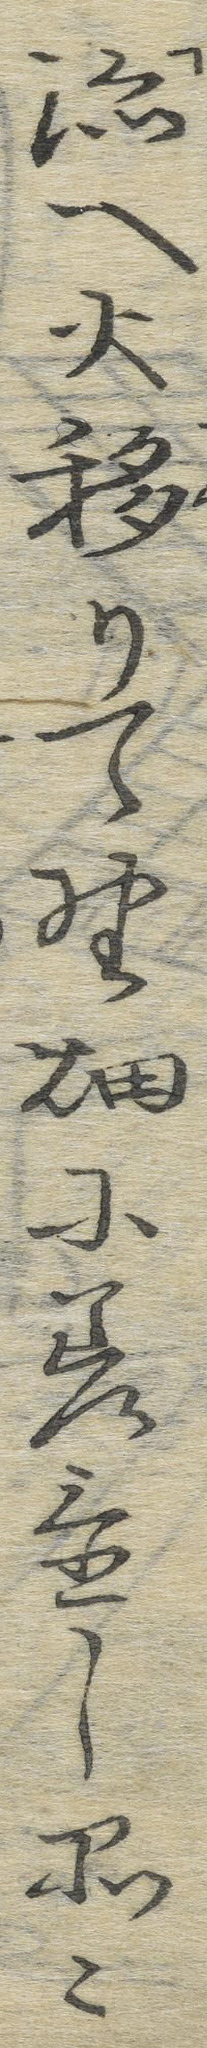跡へ火移りて野畑に差置し品〻
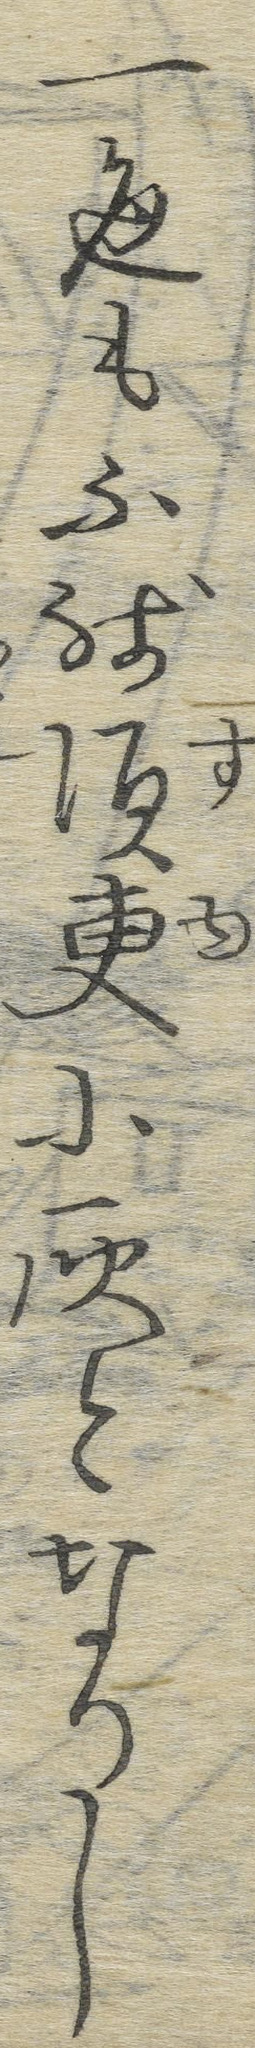一色も不残須臾に灰となりし
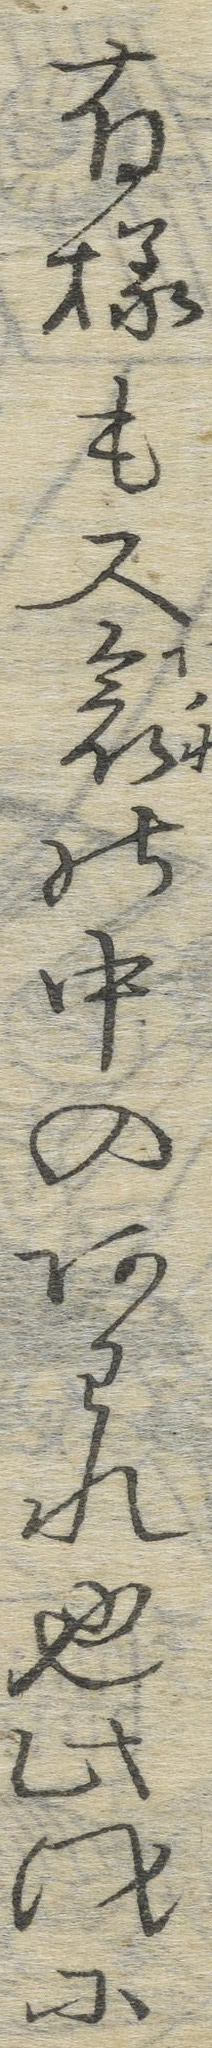有様も又哀の中のあわれ也此風に
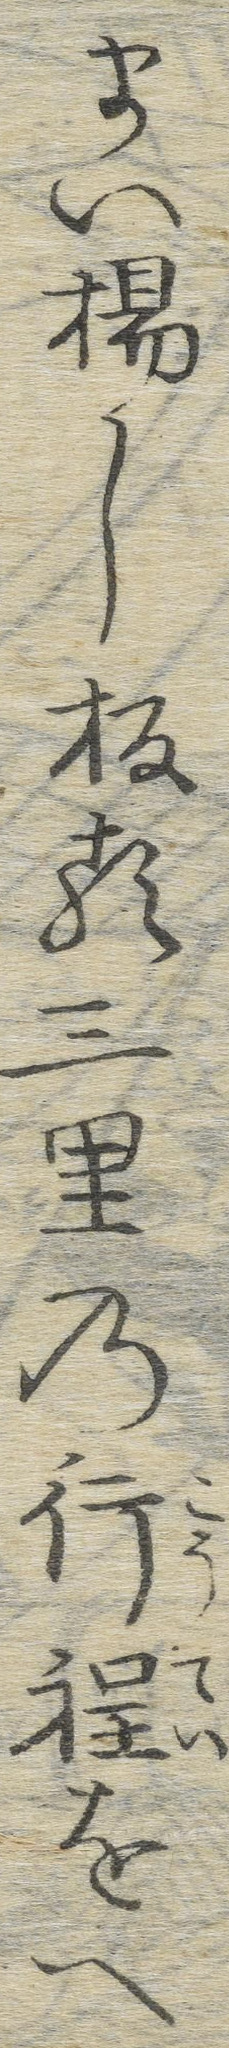まい揚し板類三里の行程をへ
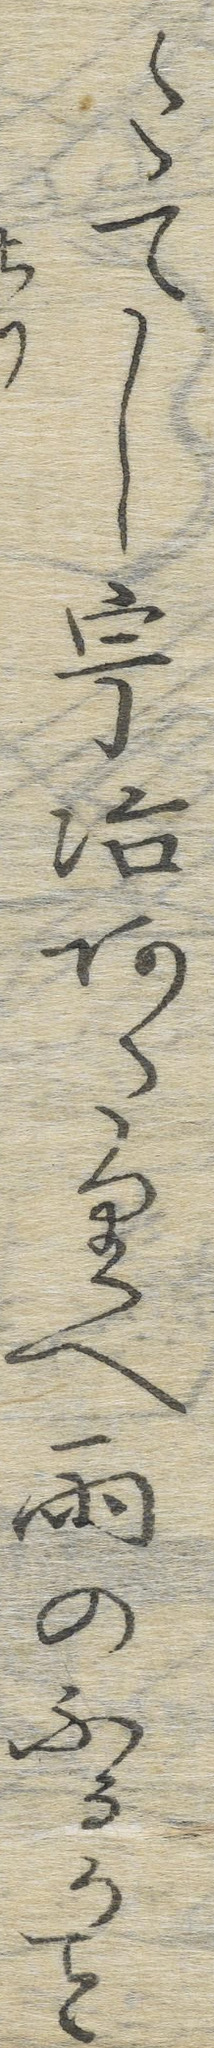たてし宇治あたりへ雨のふるかこと
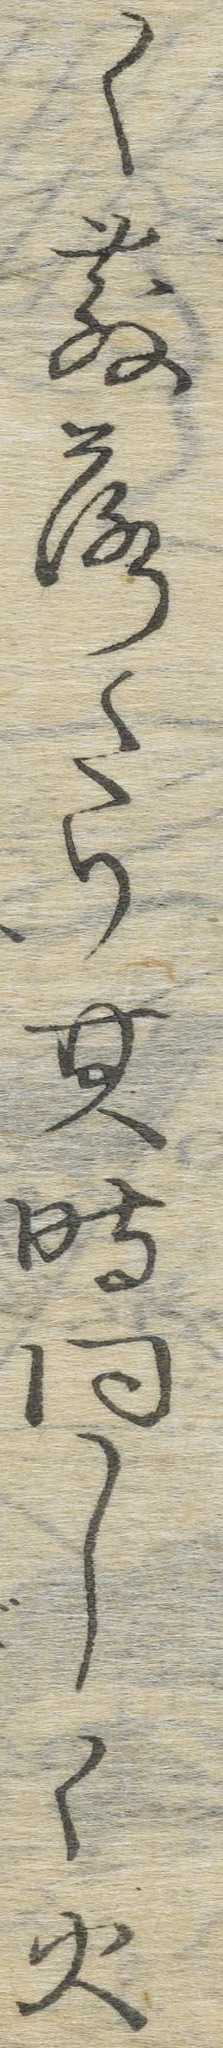く散落たり其時同しく火
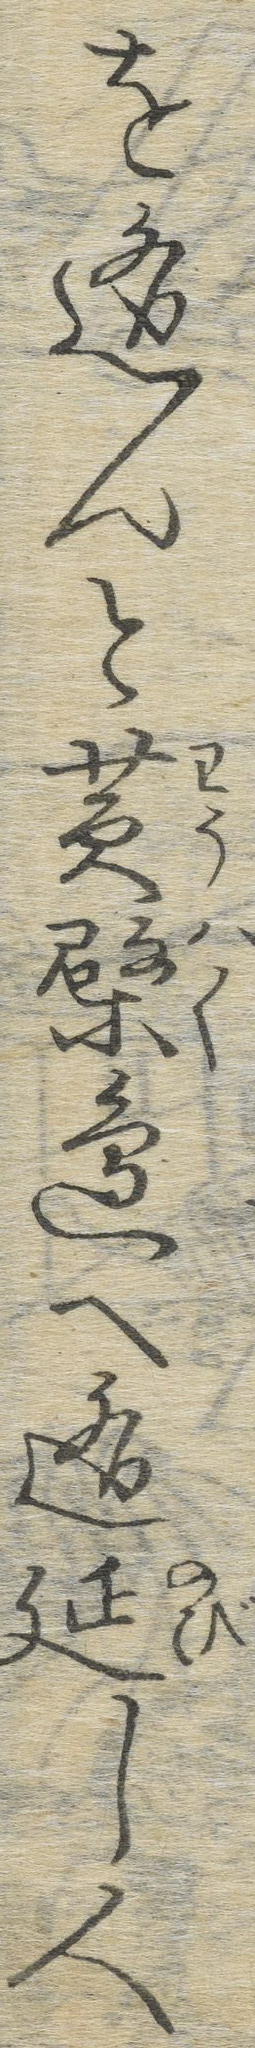を遁んと黄檗邊へ遁延し人
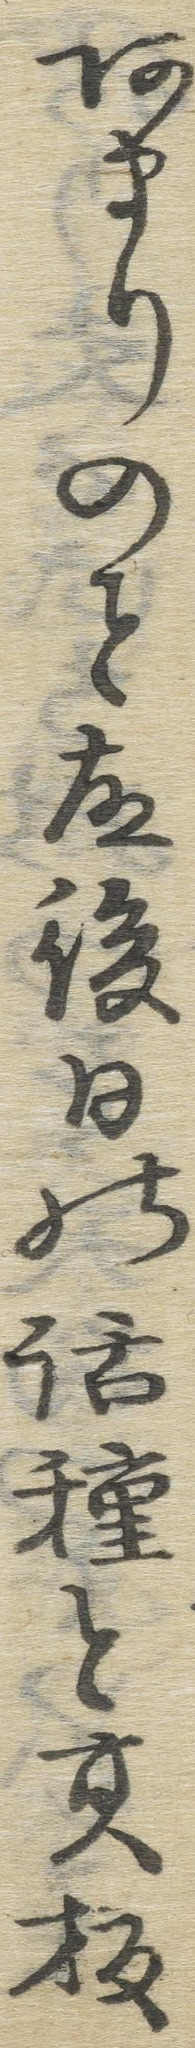あまりのこと故後日の話種と其板
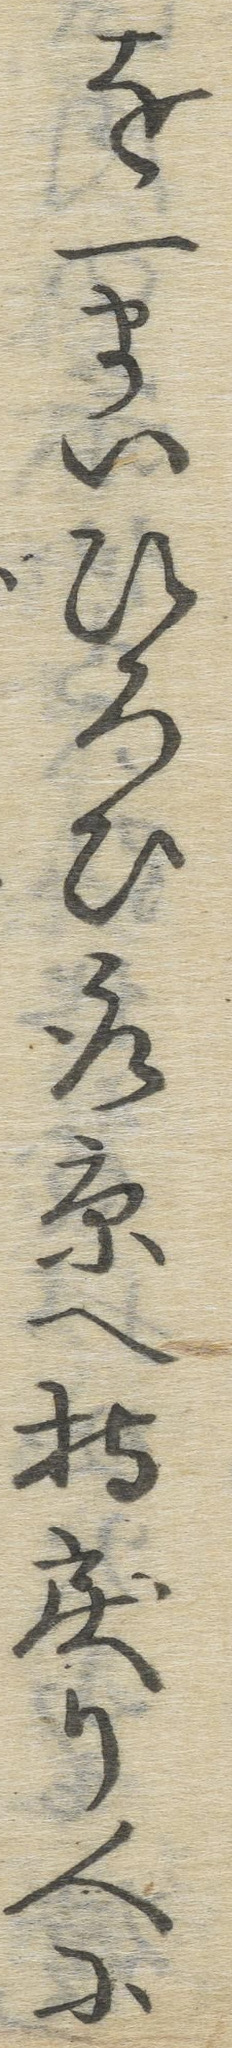を一まいひろひ取京へ持戻り人に
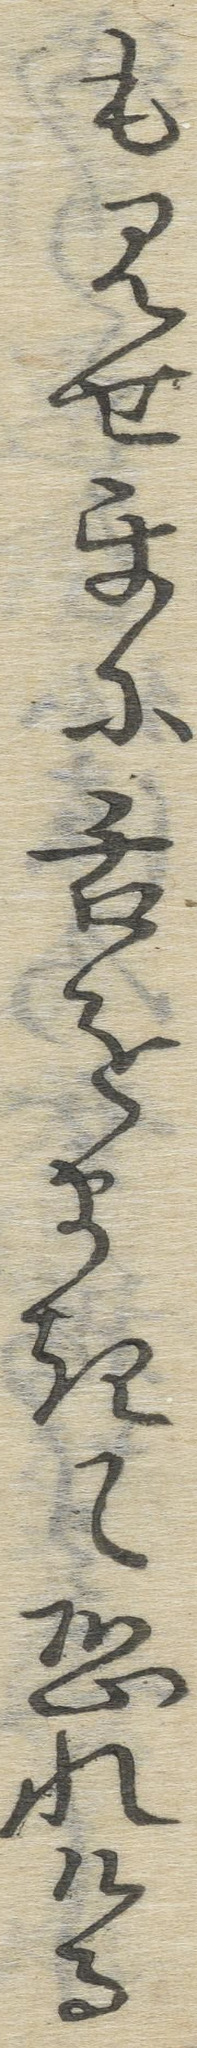も見せ互に舌をまきて恐れける
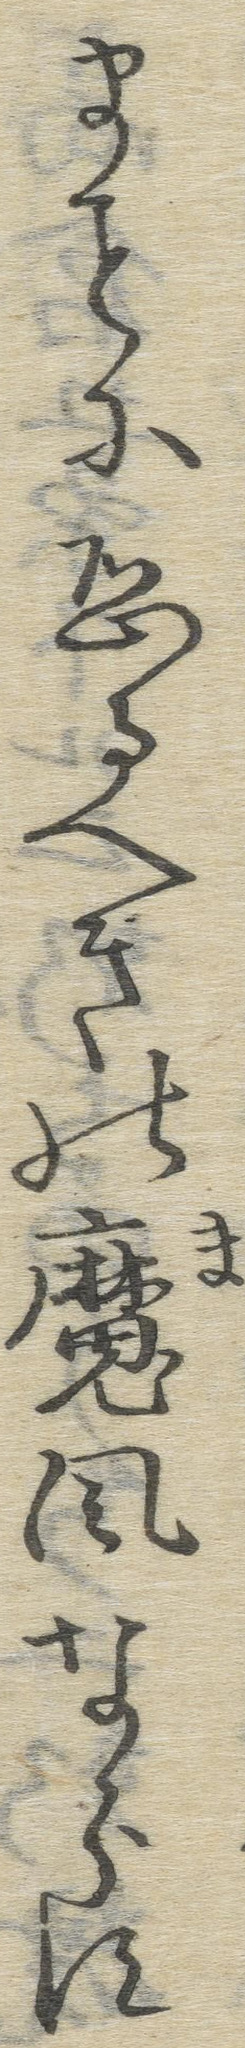まことに恐るへきの魔風ならす
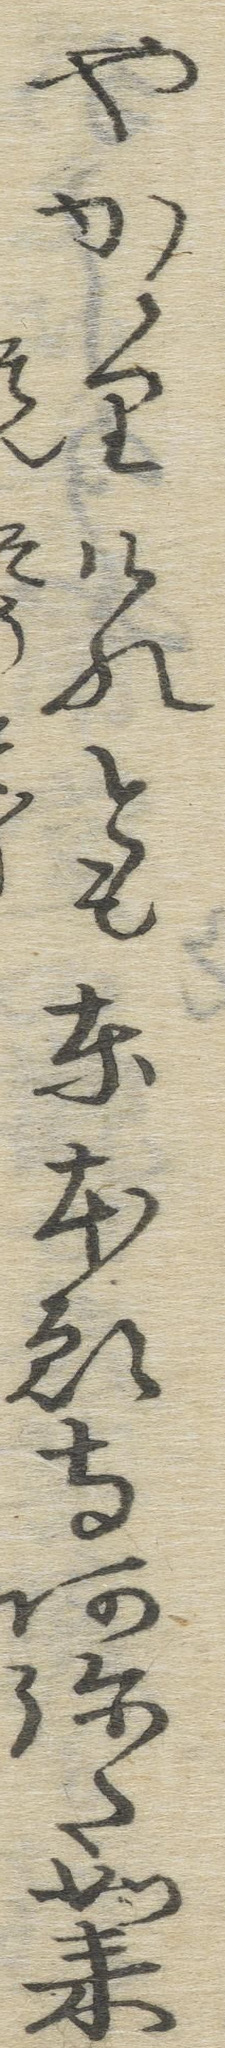やかゝりけれとも東本願寺阿弥た如来
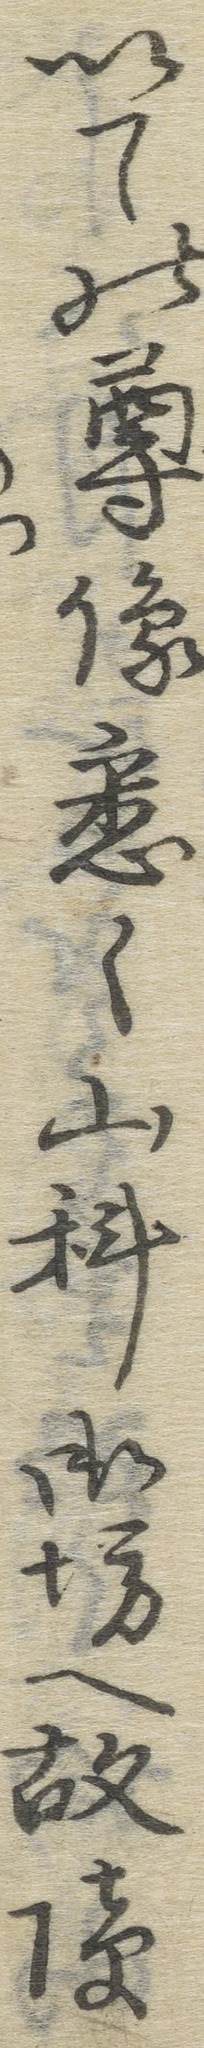以ての尊像悉く山科御坊へ故障
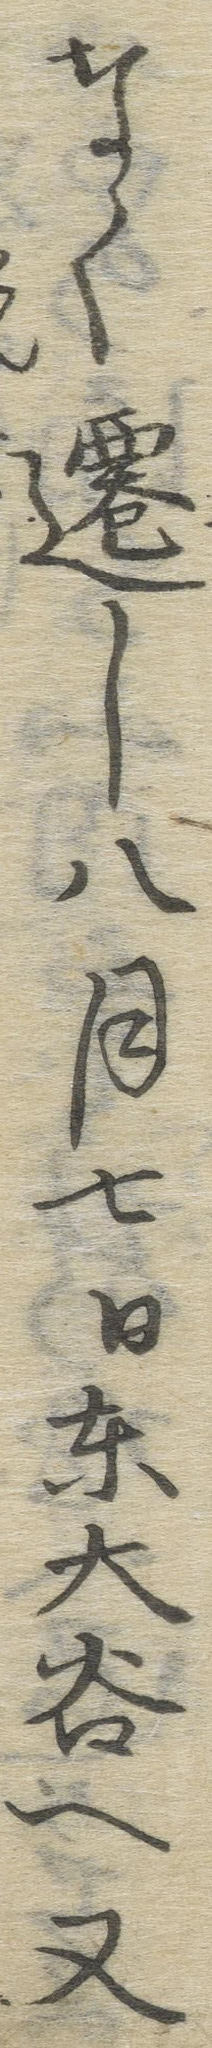なく遷し八月七日東大谷へ又
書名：あきの日照
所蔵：東京大学地震研究所図書室 Earthquake Research Institute Library, The University of Tokyo, JAPAN
